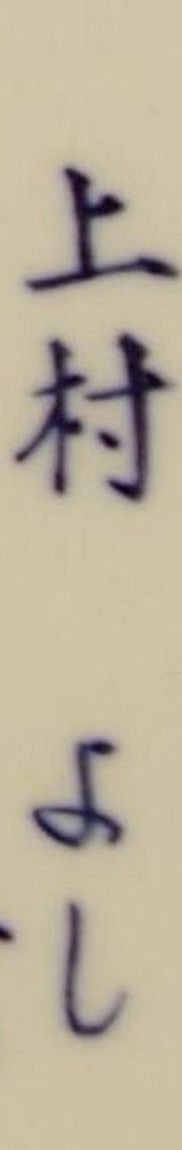上村よし
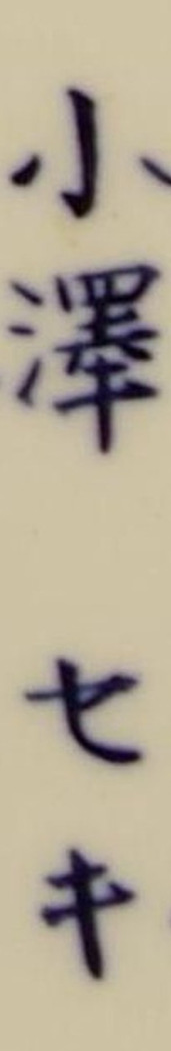小澤セキ
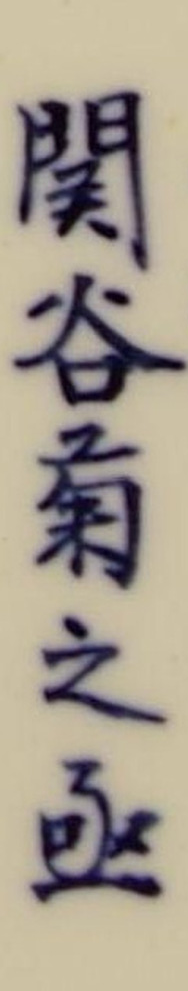関谷菊之丞
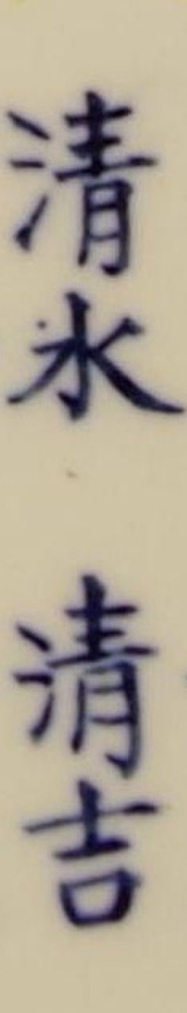清水清吉
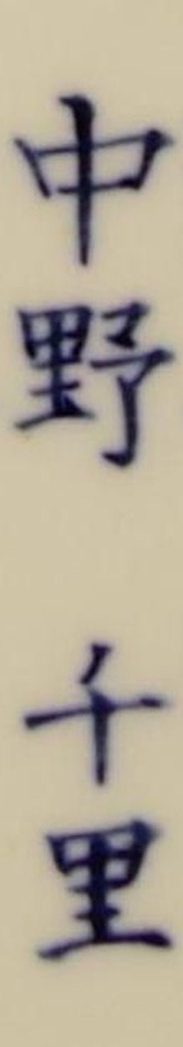中野千里
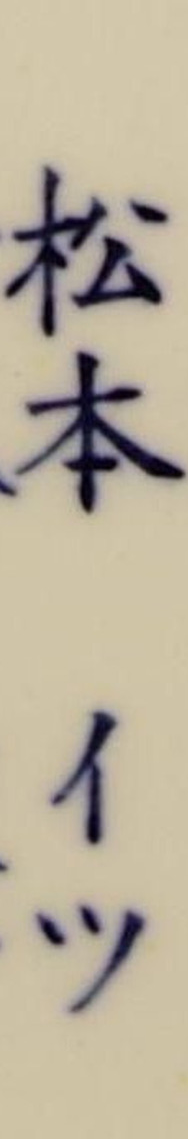松本イツ
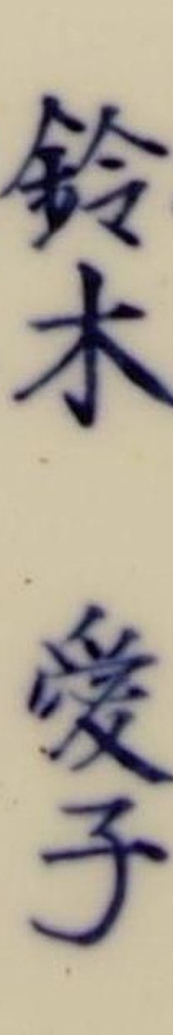鈴木愛子
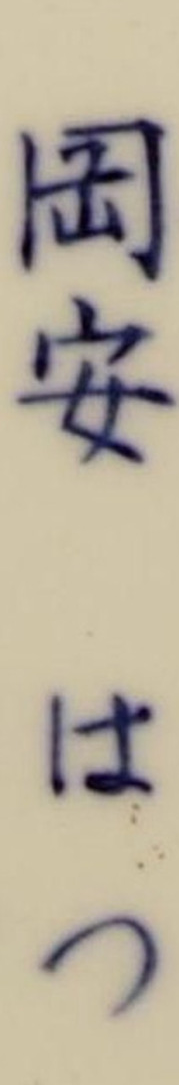岡安はつ
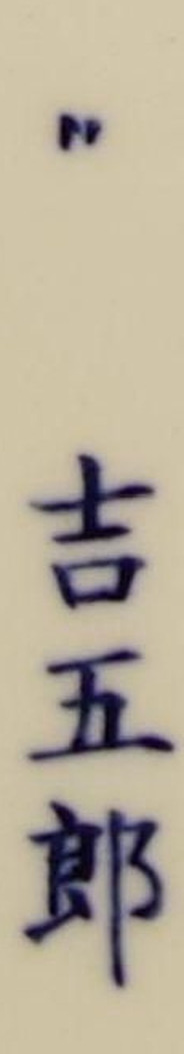吉五郎
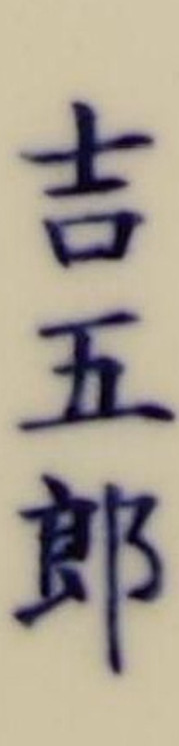吉五郎
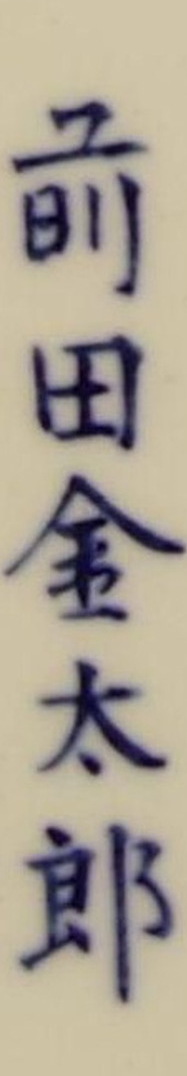前田金太郎
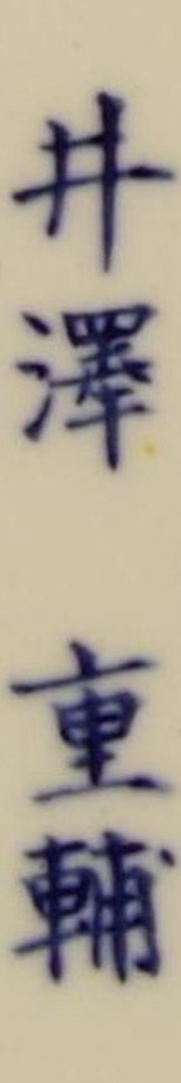井沢重輔
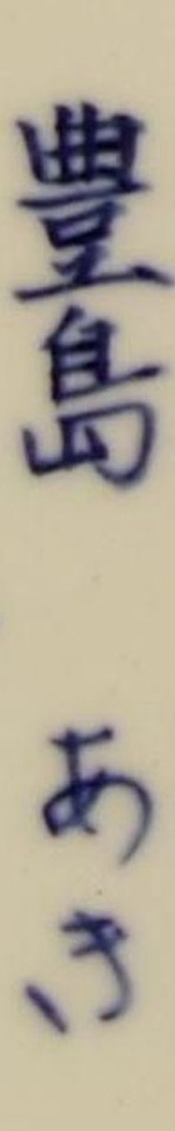豊島あき
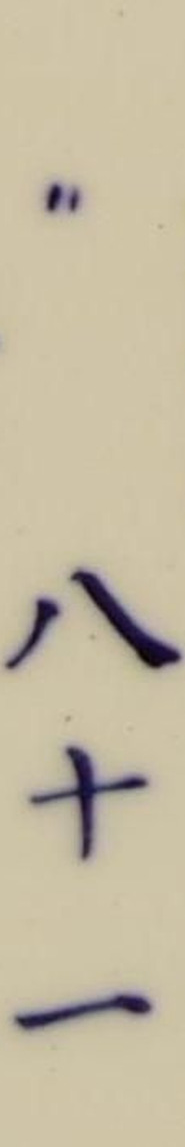八十一
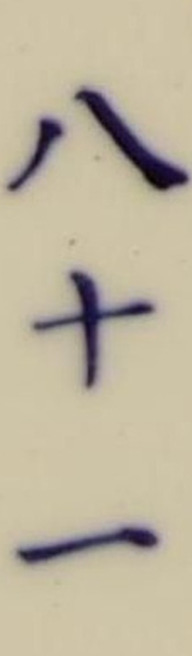八十一
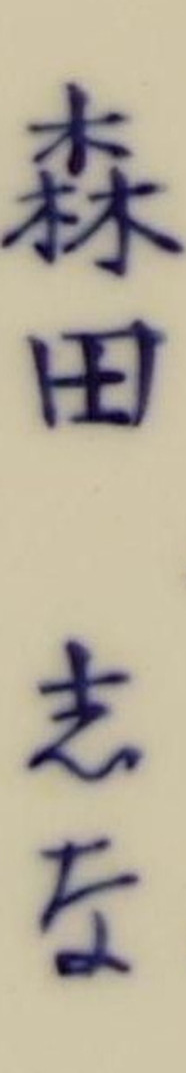森田しな
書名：E~L
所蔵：高野山金剛峯寺
